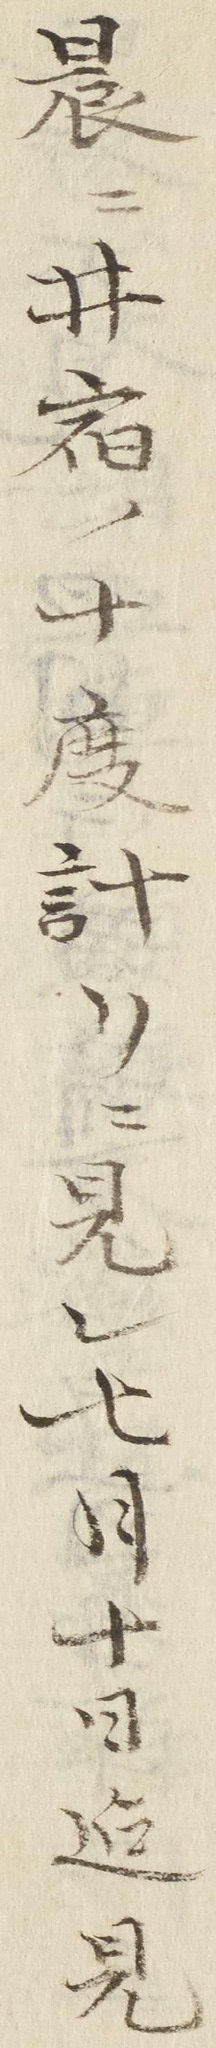晨ニ井宿ノ十度計リニ見シ七月十日迄見
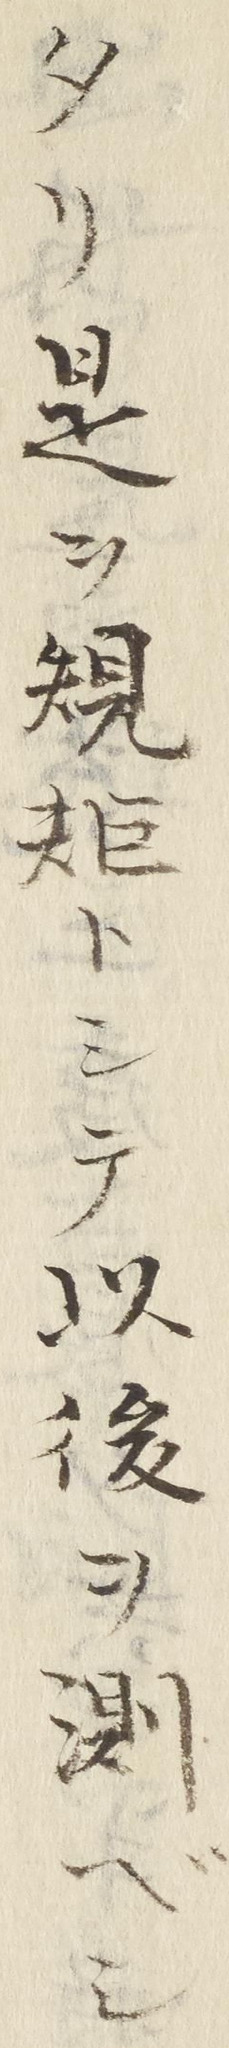タリ是ヲ規矩トシテ以後ヲ測ベシ
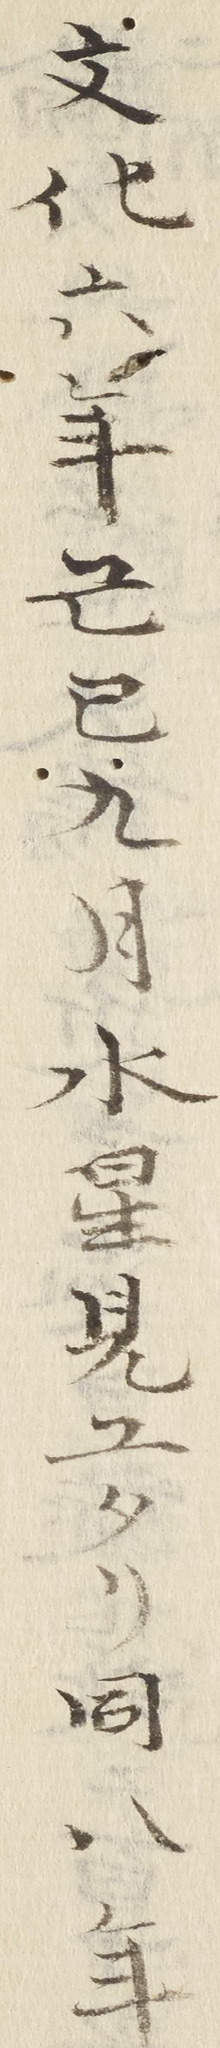文化六年己巳九月水星見ユタリ同八年
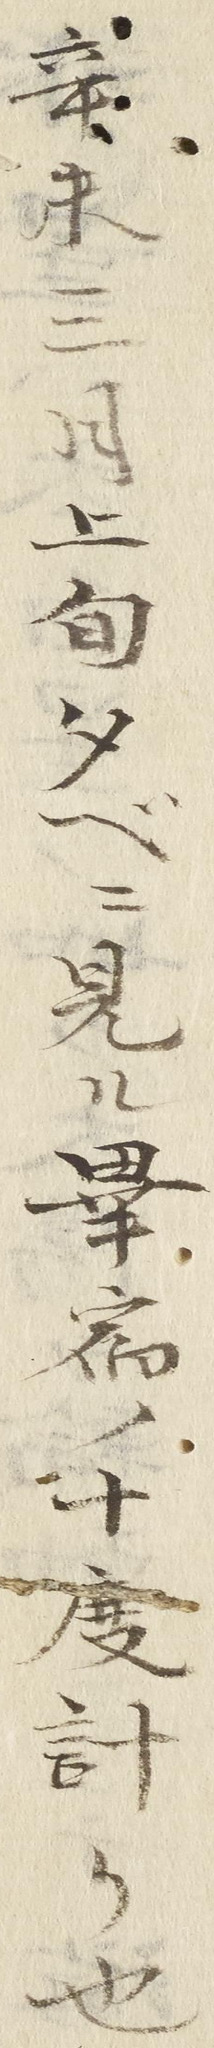辛未三月上旬夕ベニ見ル畢宿ノ十度計リ也
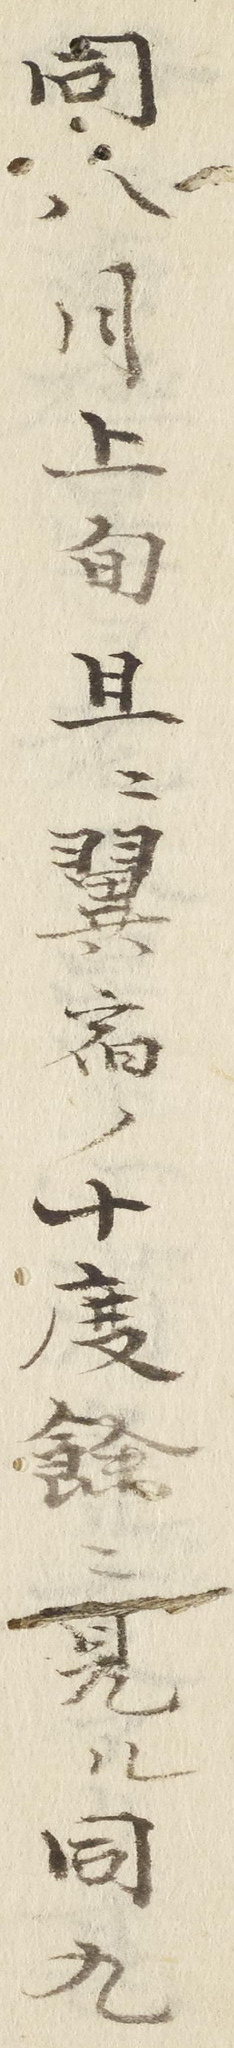同八月上旬且ニ翼宿ノ十度余ニ見ル同九
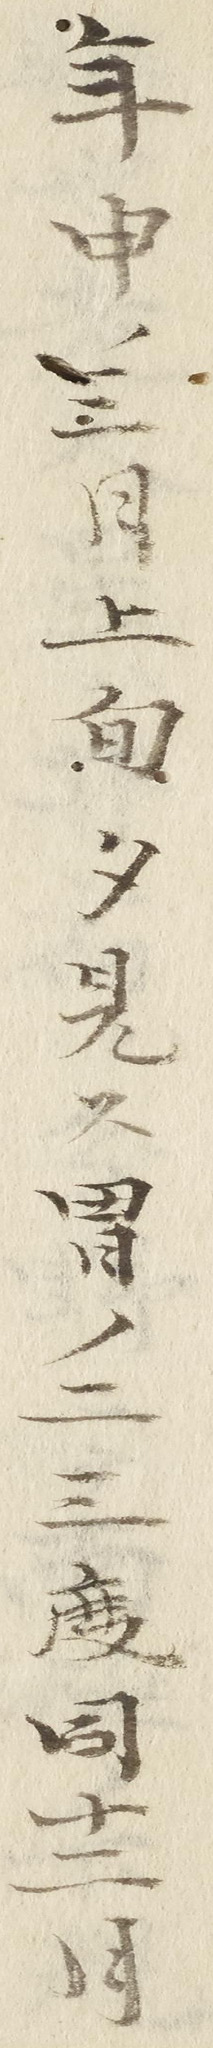年申三月上旬夕見ス胃ノ二三度同十二月
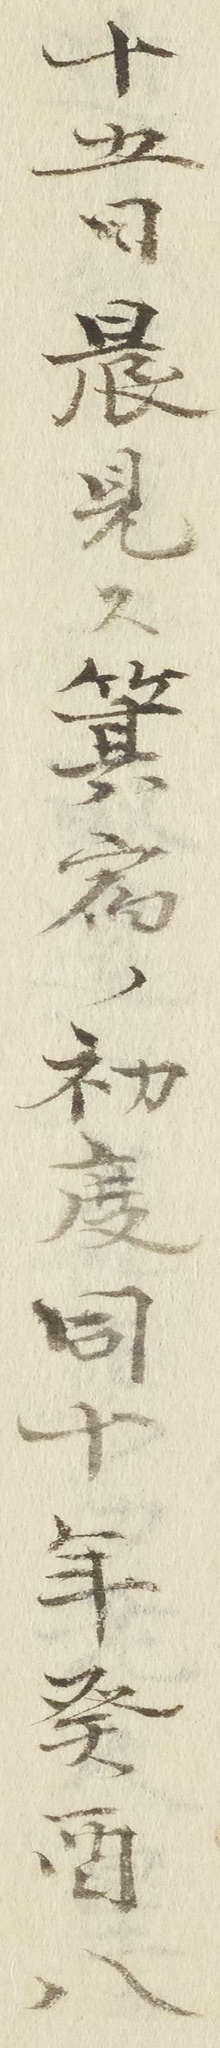十五日晨見ス箕宿ノ初度同十年癸酉八
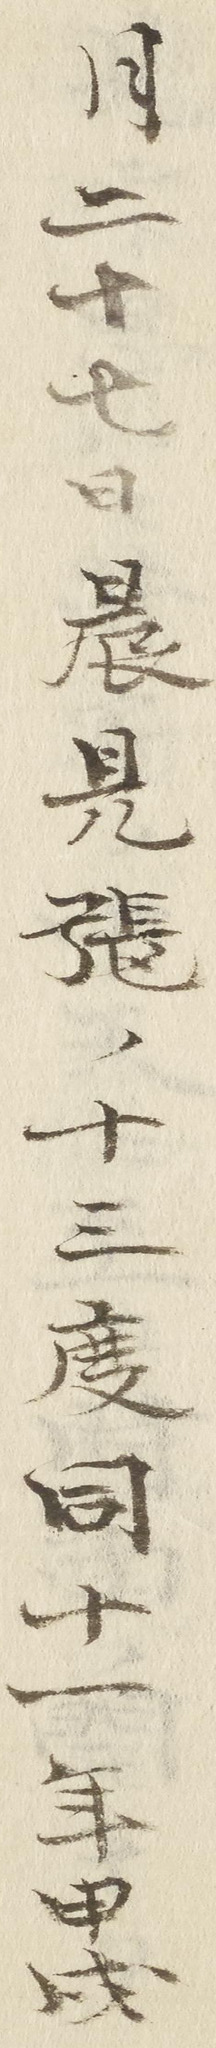月二十七日晨見張ノ十三度同十一年甲戌
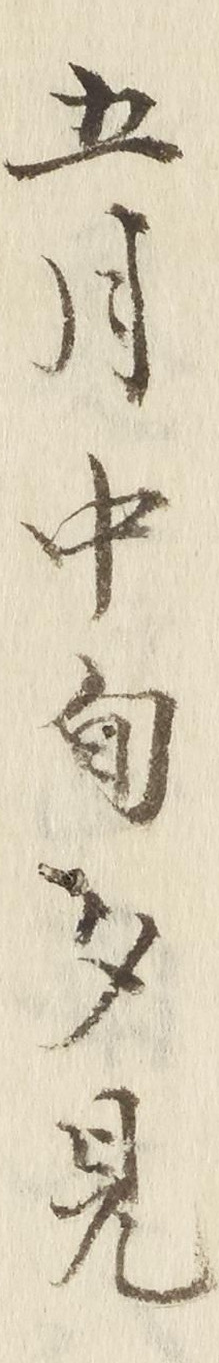五月中旬夕見

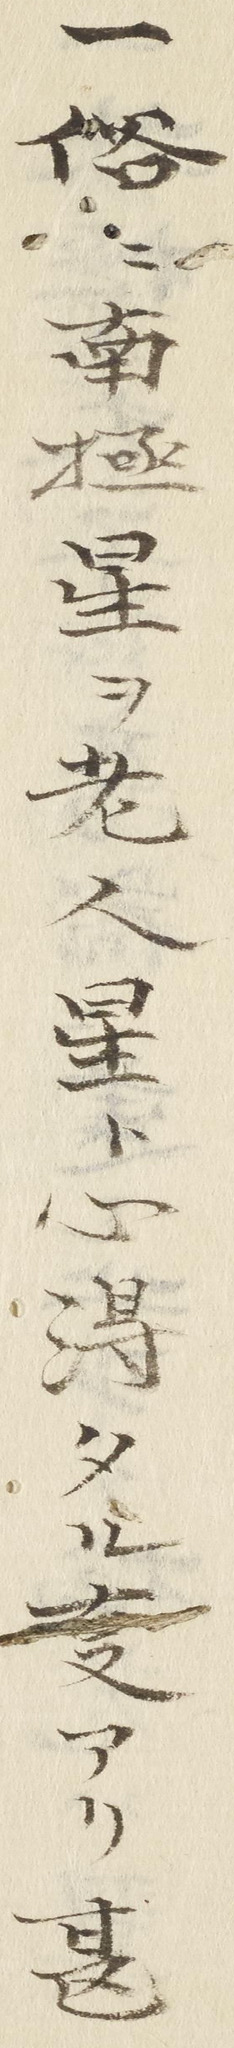一俗ニ南極星ヲ老人星ト心得タル事アリ甚
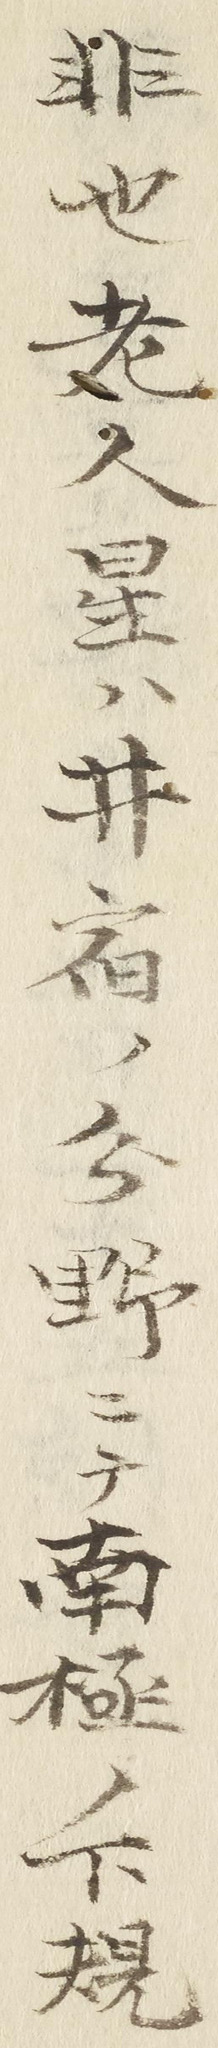非也老人星ハ井宿ノ分野ニテ南極ノ下規
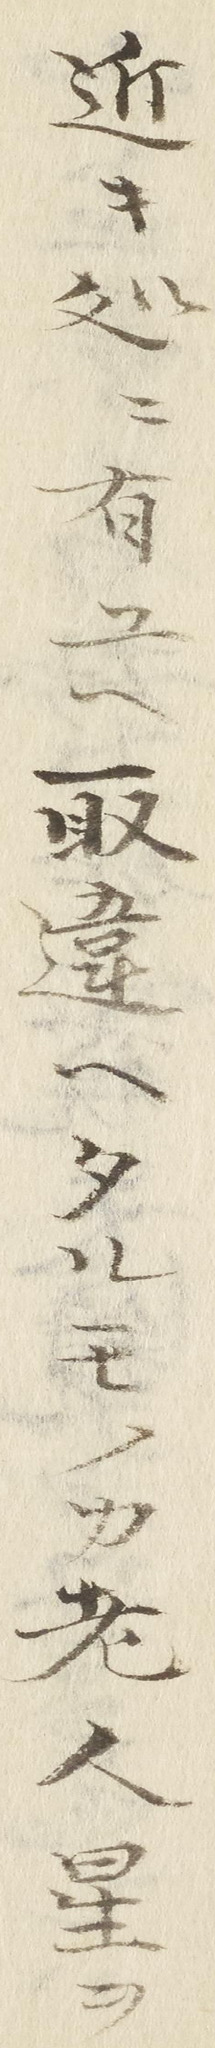近キ処ニ有ユヘ取違ヘタルモノカ老人星ヲ
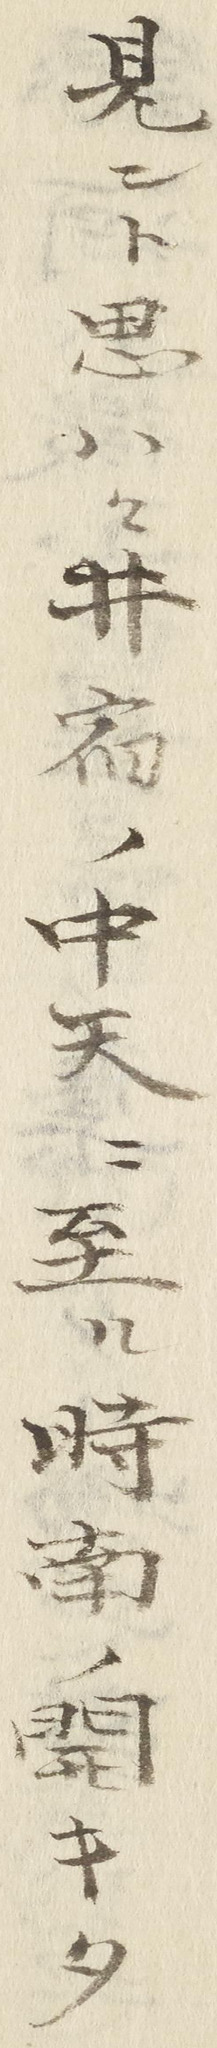見ント思ハ々井宿ノ中天ニ至ル時南ノ開キタ
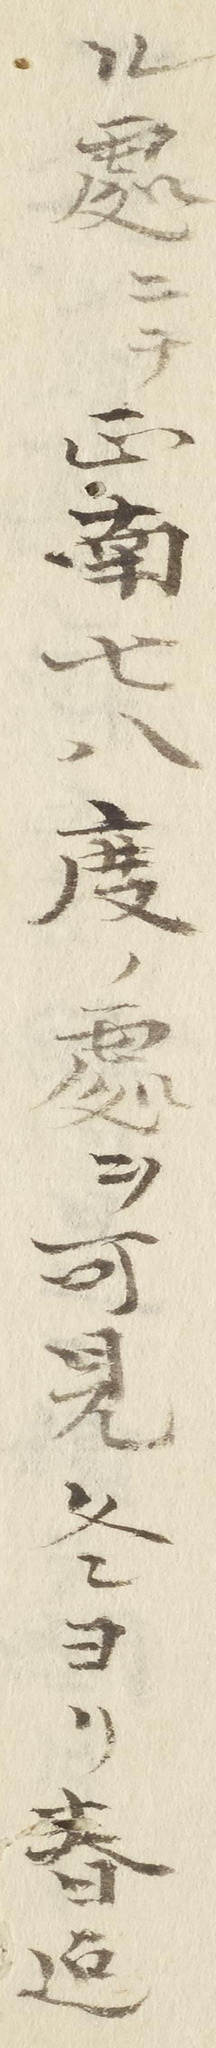ル処ニテ正南七八度ノ処ヲ可見冬ヨリ春迄
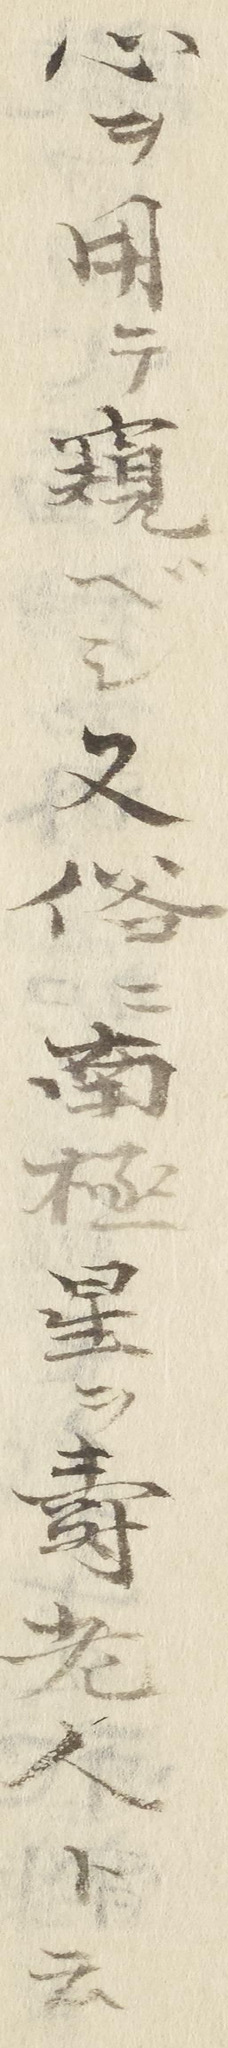心ヲ用テ窺ベシ又俗ニ南極星ヲ寿老人ト云

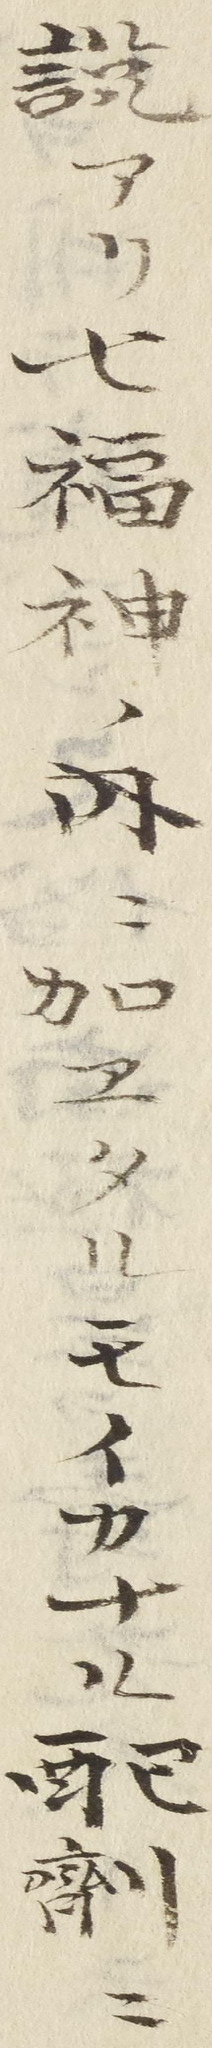説アリ七福神ノ内ニ加ヱタルモイカナル配剤ニ
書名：天象話説
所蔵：東京大学地震研究所図書室 Earthquake Research Institute Library, The University of Tokyo, JAPAN
